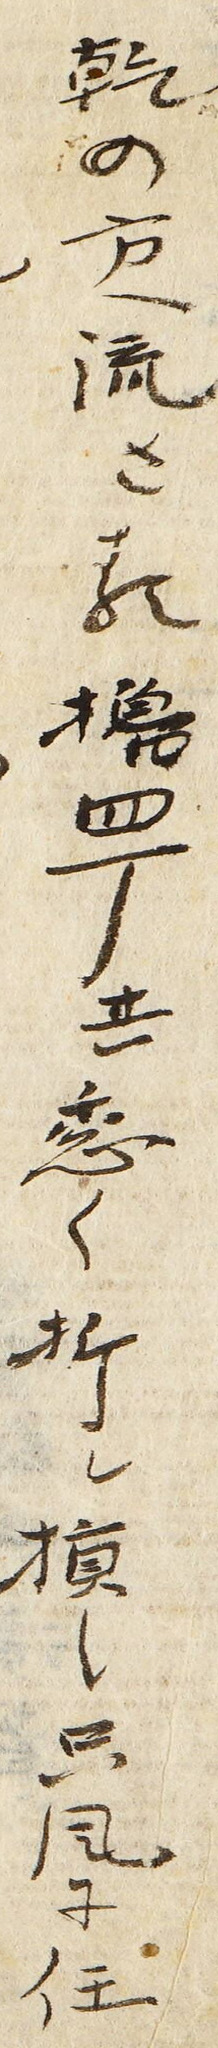乾の方へ流さる櫓四丁共悉く折れ損し只風に任
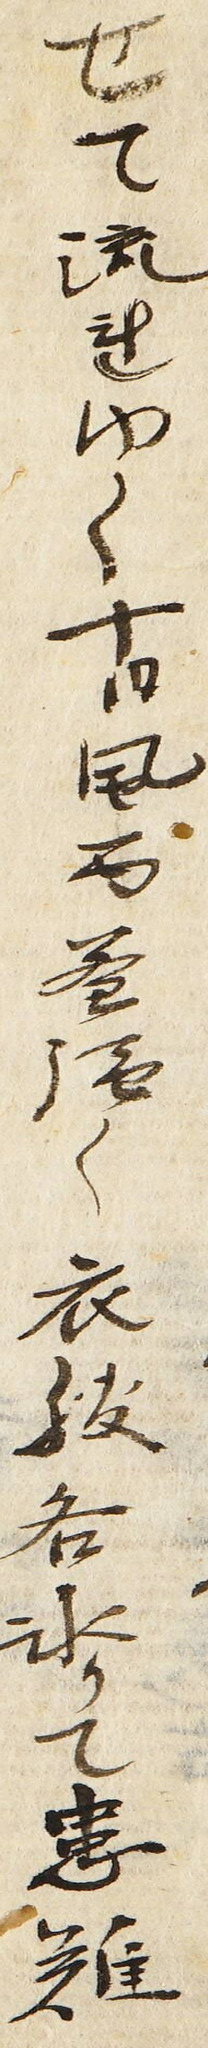せて流れゆく十日風雨益強く衣服各氷りて患難
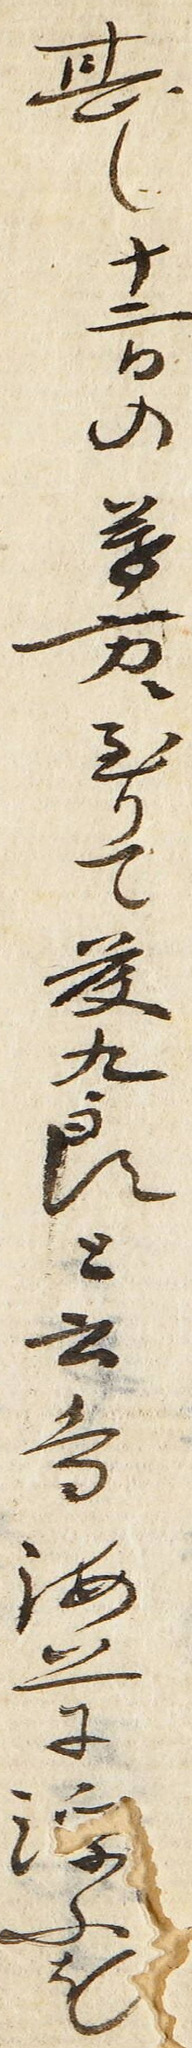甚し十二日の暮方に至りて藤九郎と云鳥海上に浮ふを
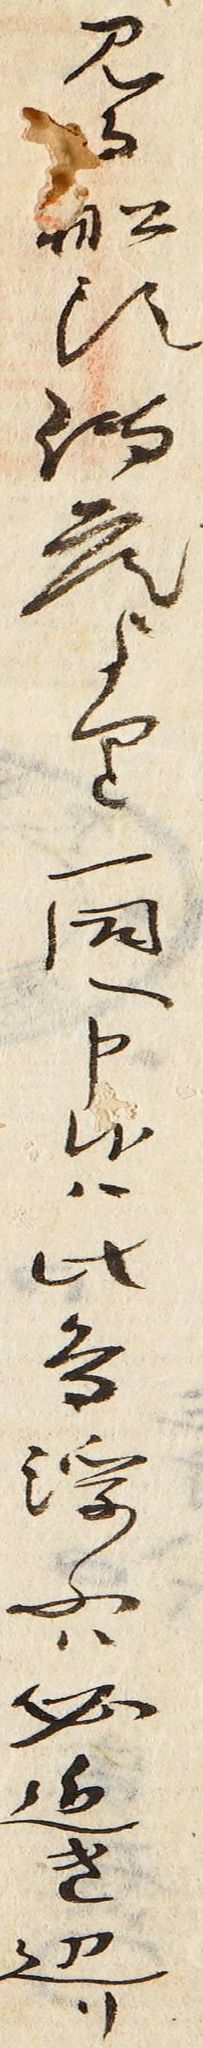見る船頭伝蔵より一同へ申候は此鳥浮ふは必近き辺り
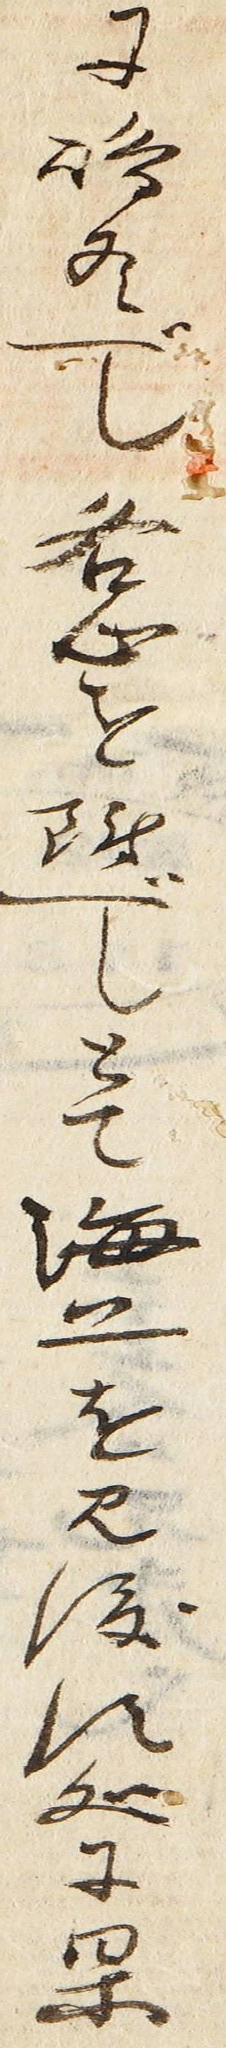に島有べし各心を附べしとて海上を見渡す処に果
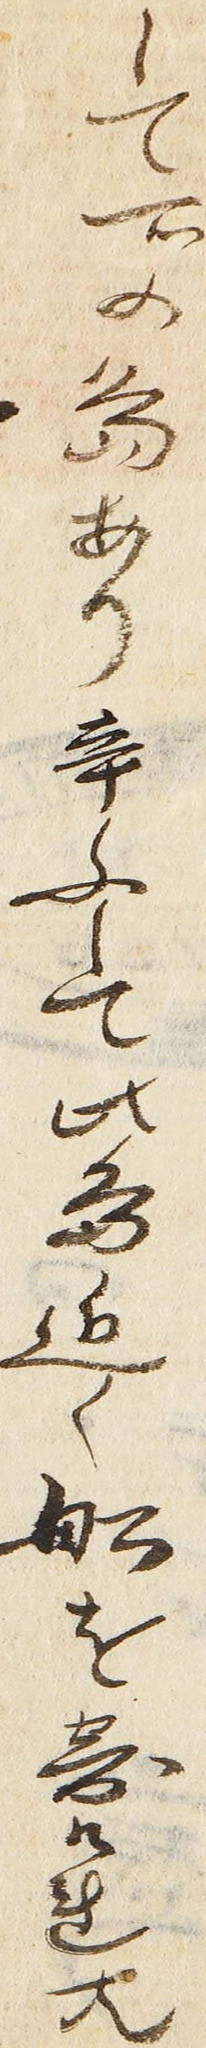して石の島あり辛ふして此島近く船を寄けれは
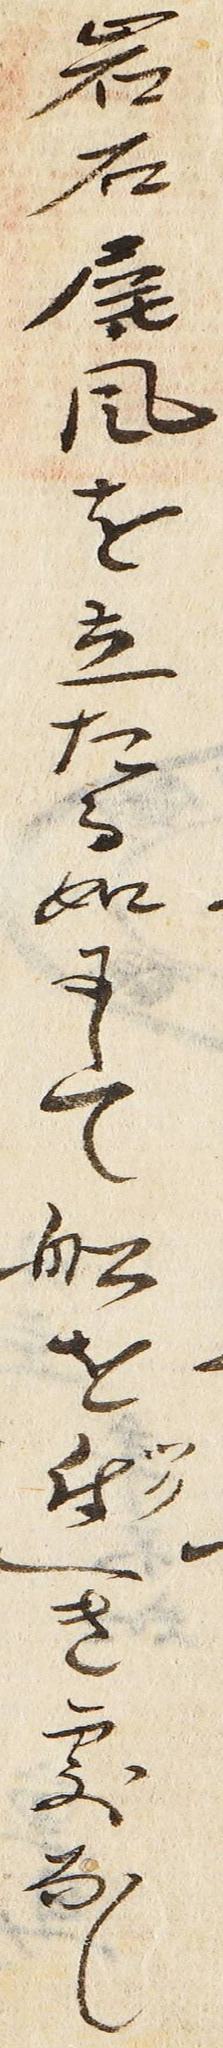岩石屏風を立たる如にして船を付へき処なし
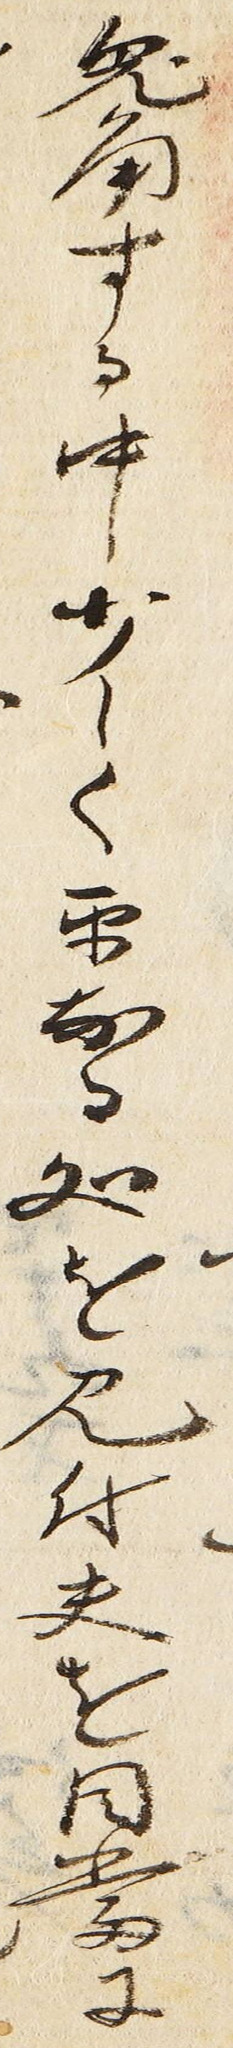兎角する中少しく平なる処を見付夫を目当に
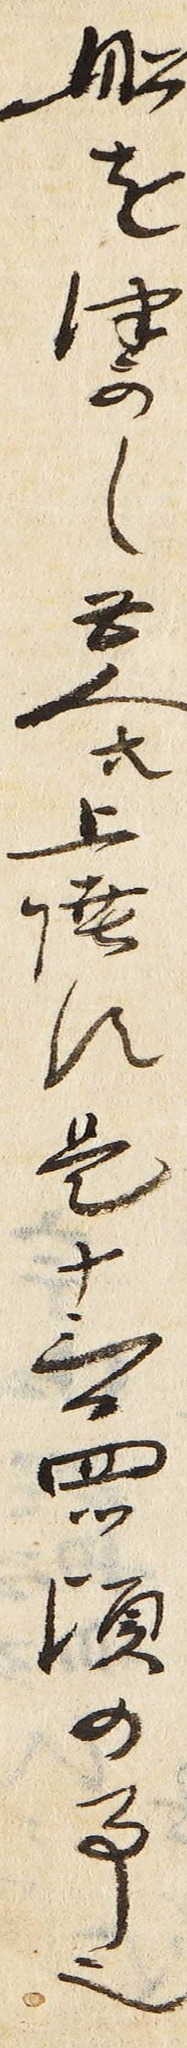船をつかし五人共上陸す是十三日四ツ頃の事也
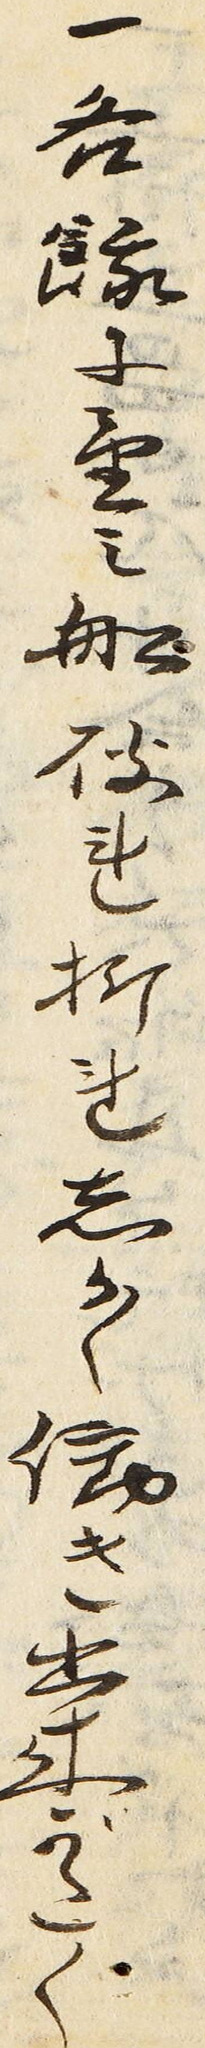一各餓に望み船破れ折れしかく働き出来かたく
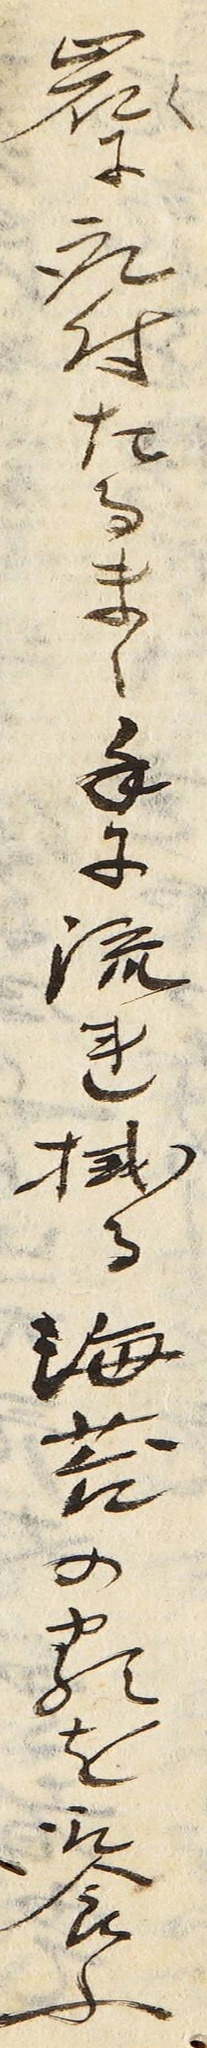岩に取付たるまゝ手に流れ掛る海苔の類を取食ふ
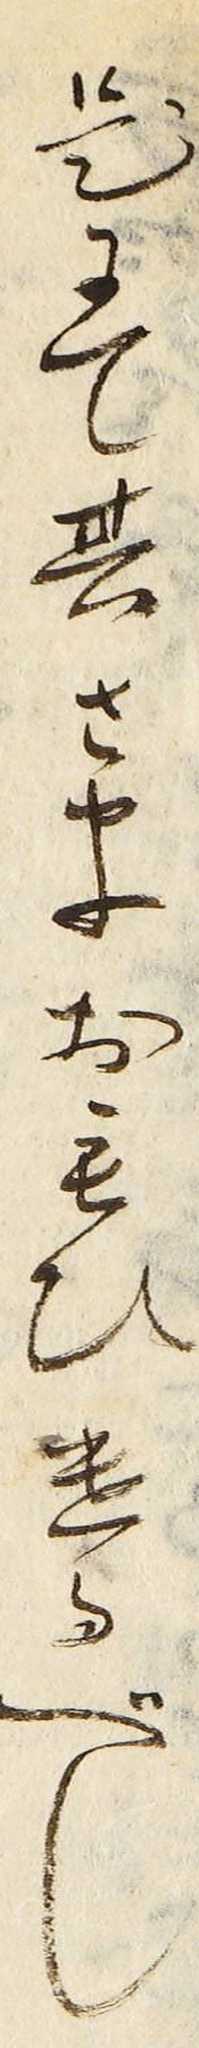是にて其さまおもひ遣るべし
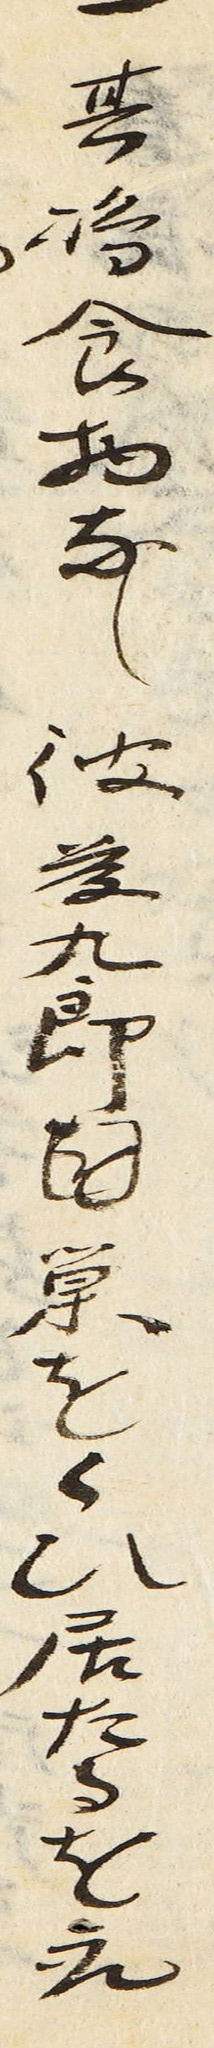一其島食物なし彼藤九郎を巣をくひ居たるを取
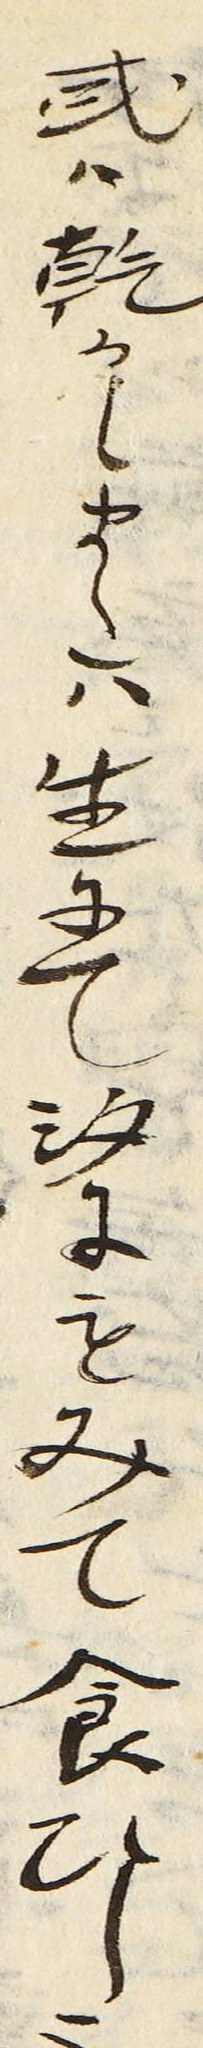或は乾かしまたは生にて汐にもみて食ひし也
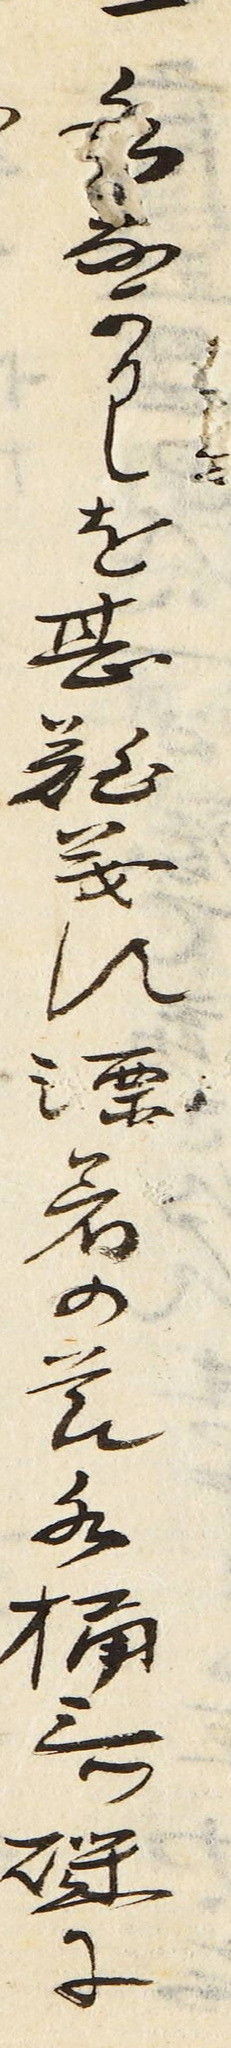一水なかりしを甚難義す漂着の節水桶三ツ磯に
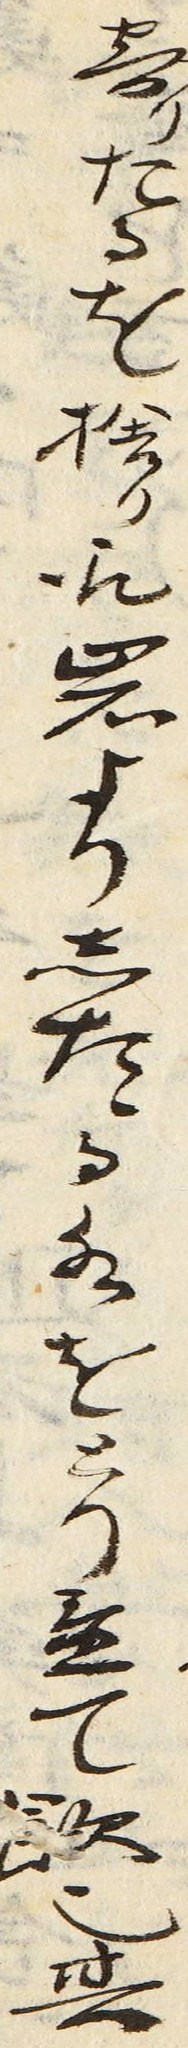寄りたるを捨り取岩よりしたゝる水をとり置て飲也其
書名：宇佐浦より漂流留
